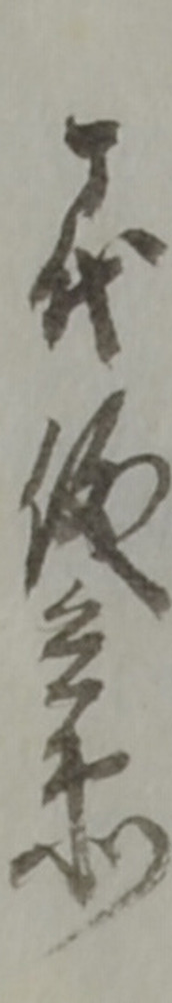丁代儀兵衛
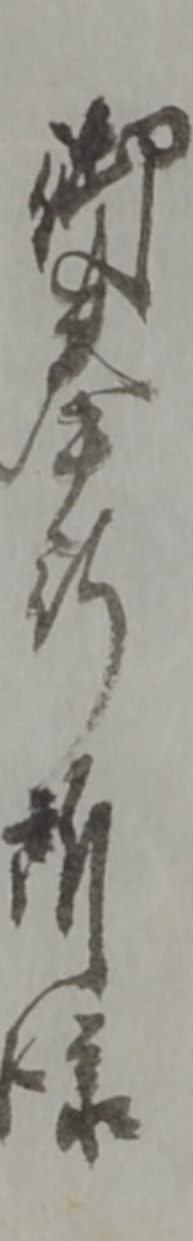御奉行所様
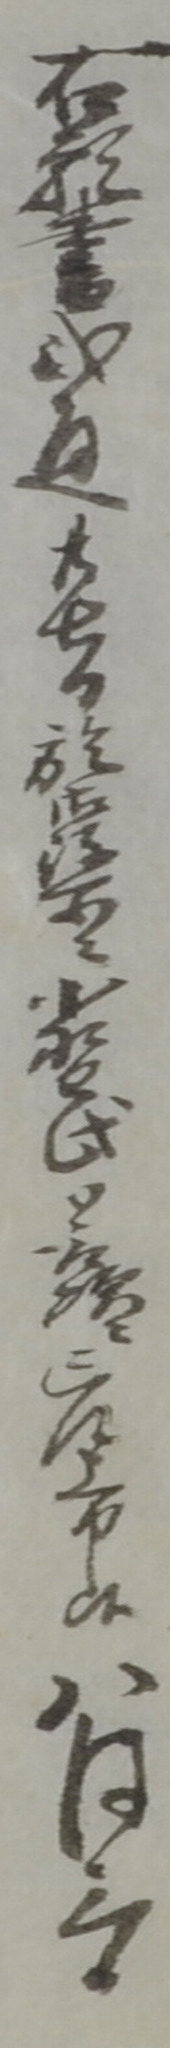右願書弐通廿七日於御役所ニ少習氏御取次ニ差上申候八月三日
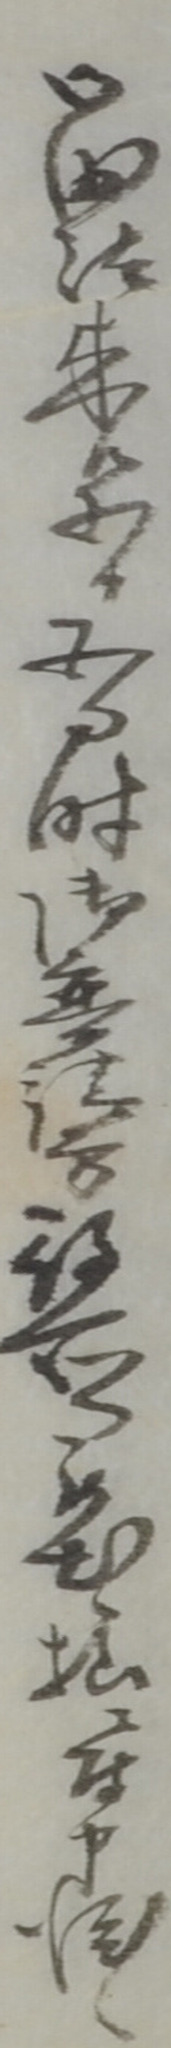御沙汰来ル五日五ツ時御普請方役所へ罷出候様ニ付申渡候

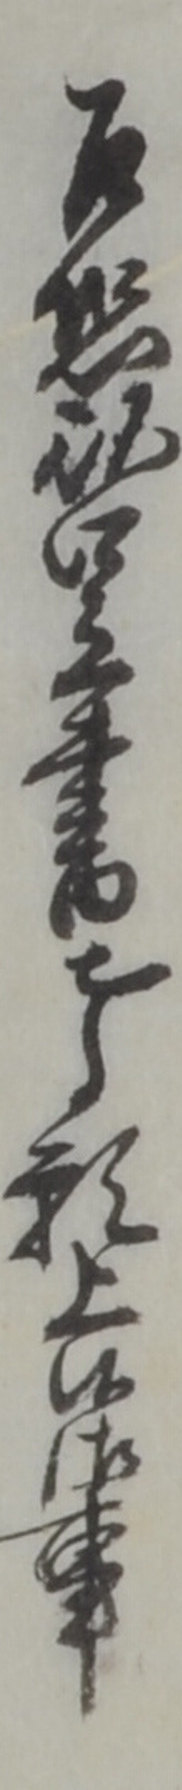乍恐以口上書奉願上候御事
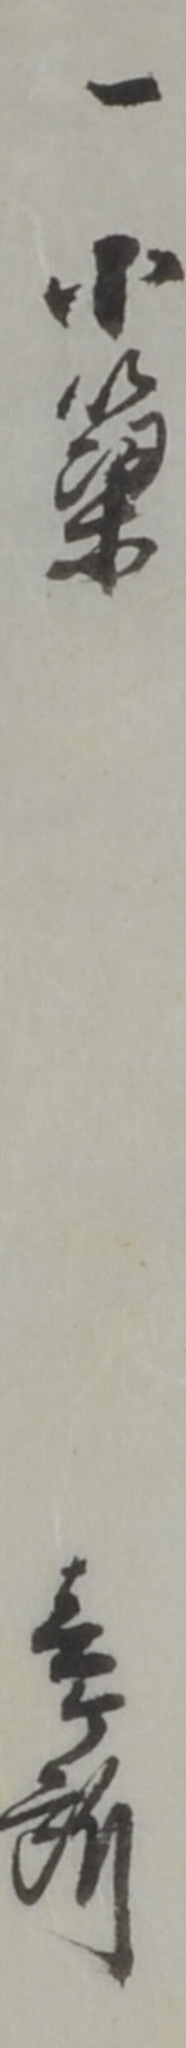一小簗壱ヶ所
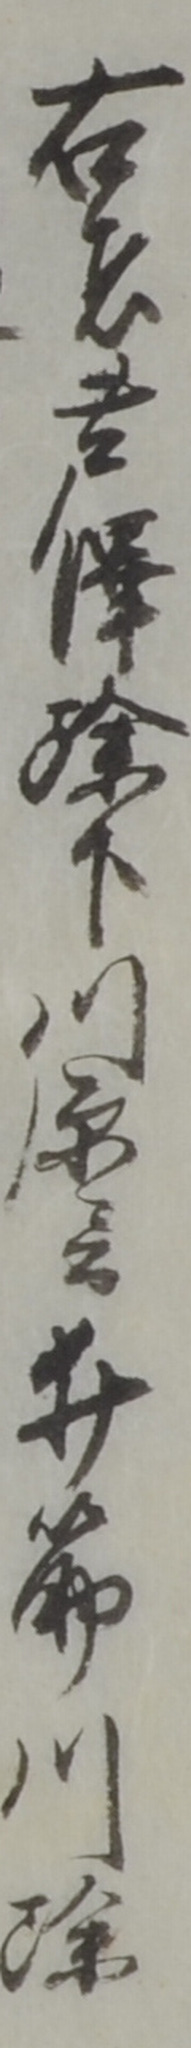右者芦澤除下川原ニ而井筋川除
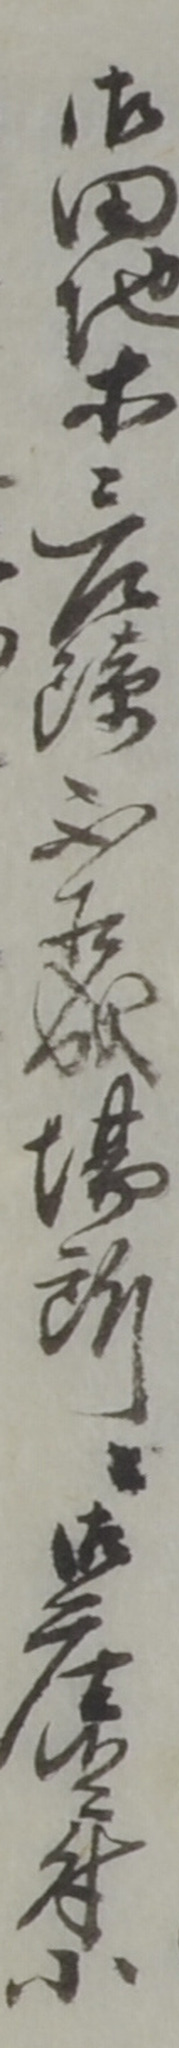御田地等ニ石障不相成場所ニ御座ニ付小
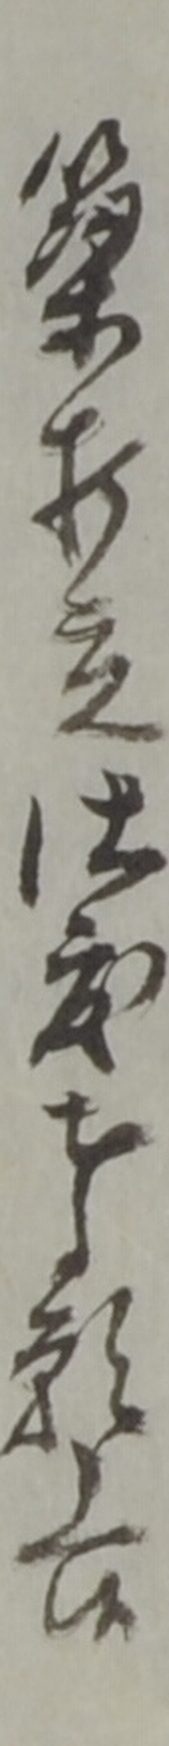簗打立仕度奉願上候
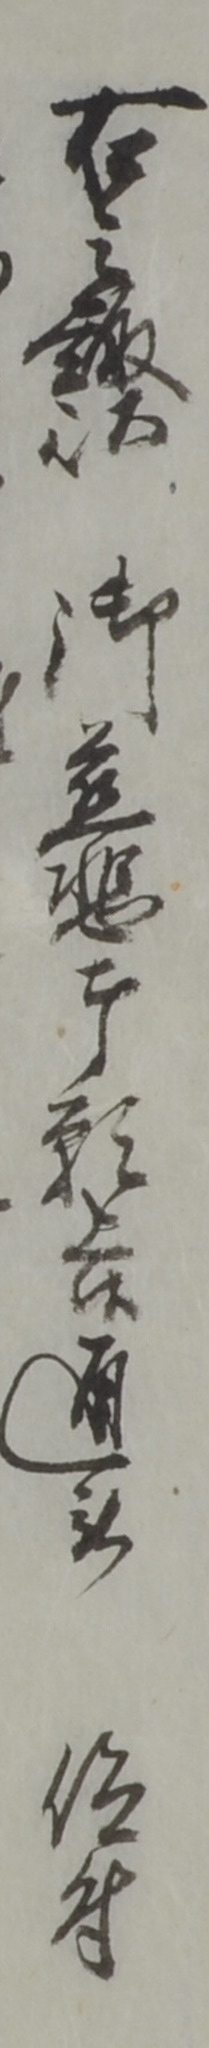右之趣以御慈悲奉願上候通被仰付
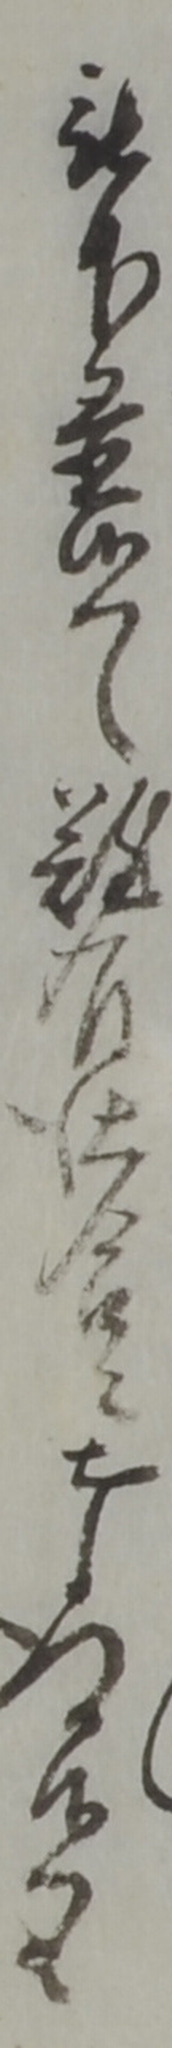被下置候ハヽ難有仕合ニ奉存候以上
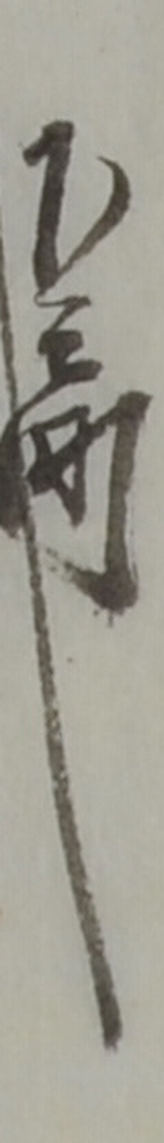下里町
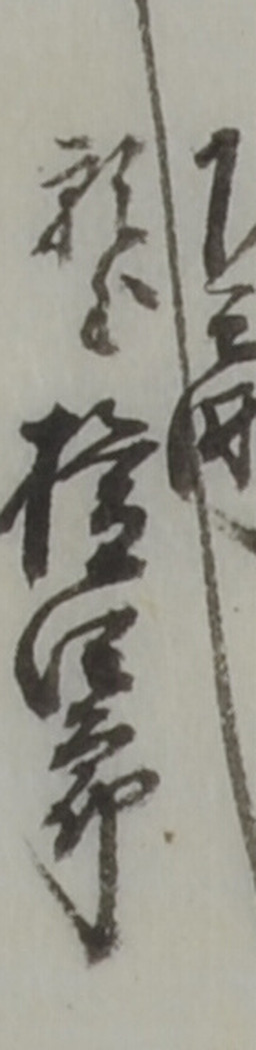願主権四郎
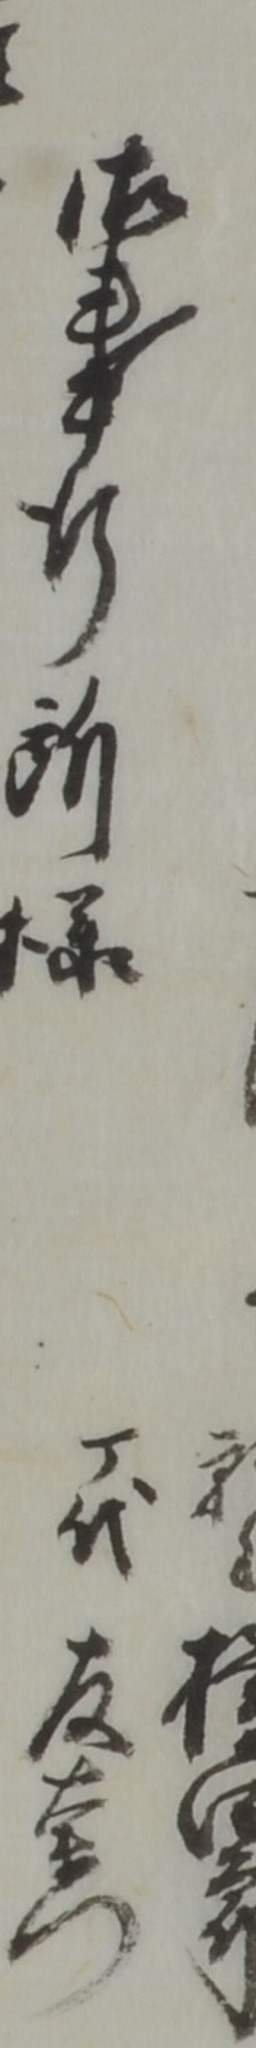御奉行所様丁代友右衛門
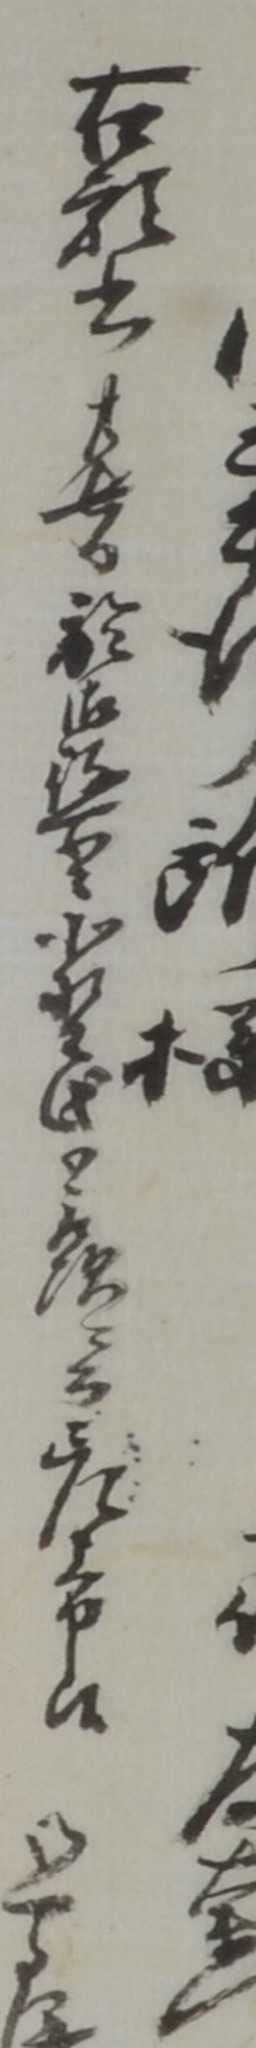右願書廿七日於御役所小野氏御取次ニ而差上申候御聞済
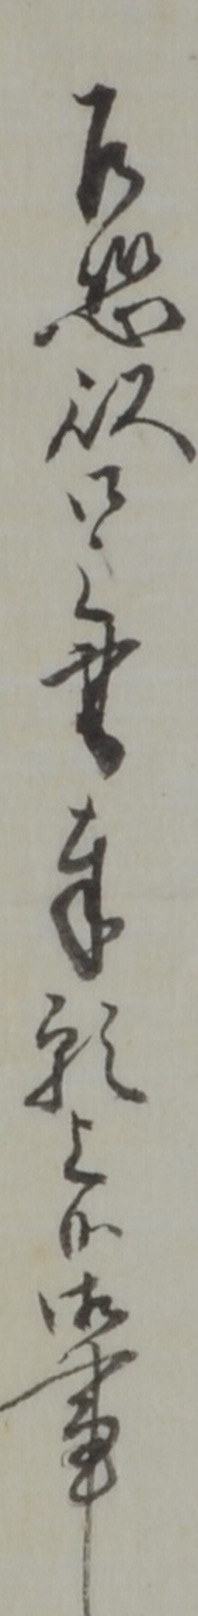乍恐以口上書奉願上候御事
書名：諸願書控簿
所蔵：伊那市立高遠町図書館・合同会社AMANE
